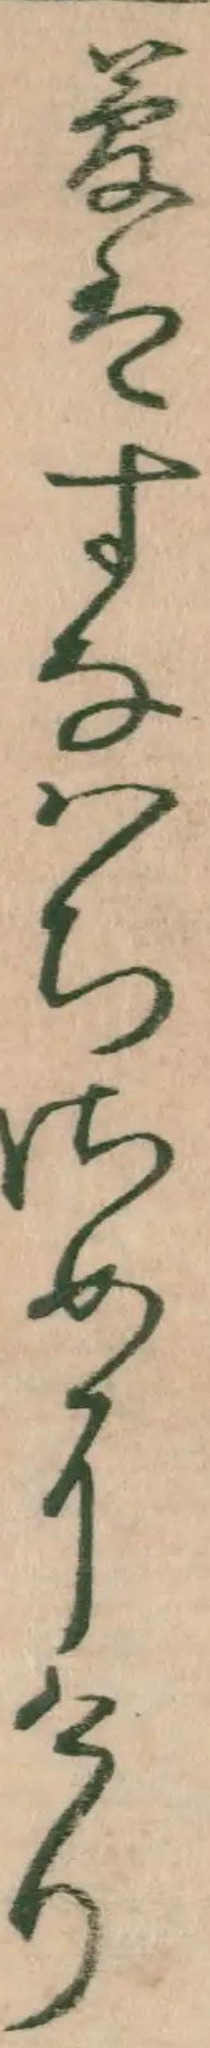夢はすなはちさめにけり

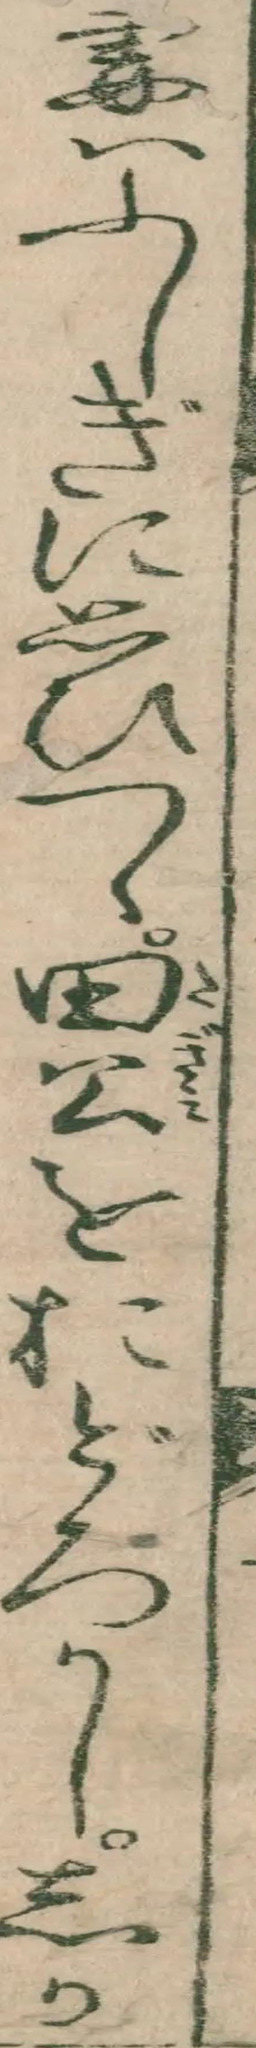妻はふしぎに思ひつゝ。田公をおどろかし。しか
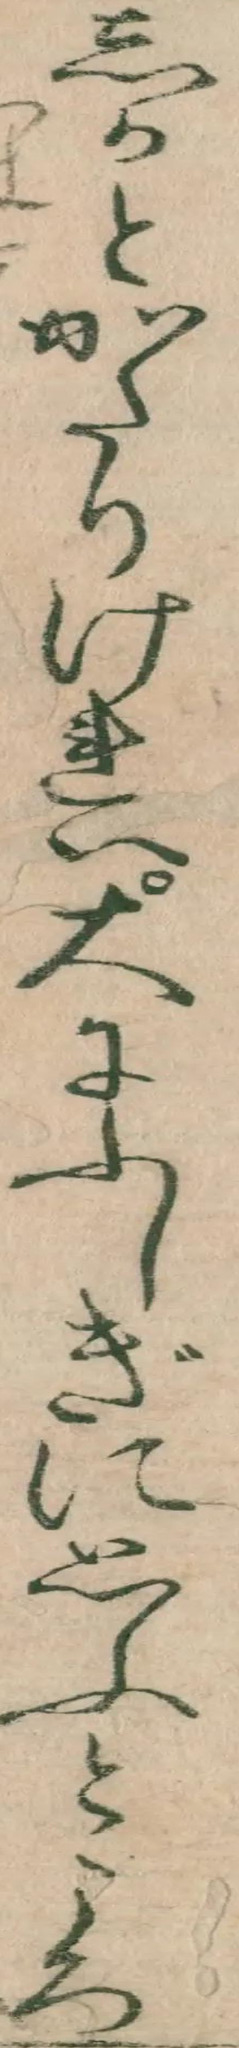しかとかたりけれは大にふしぎに思ふところ
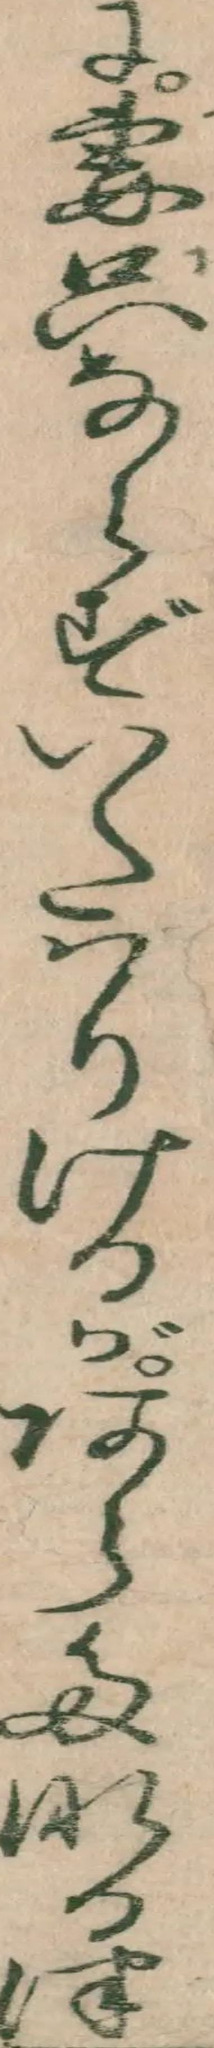に。妻只ならずいたはりけるが。あらたなるつ
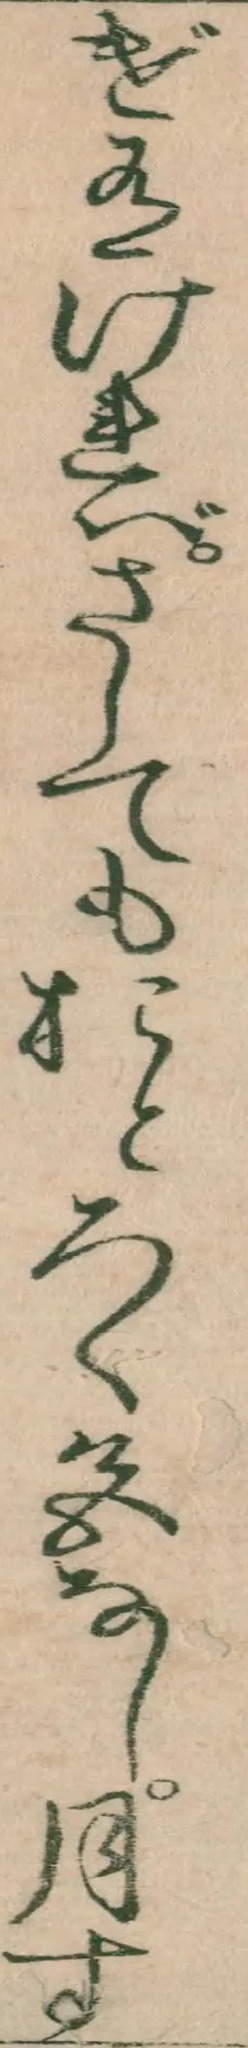げ有ければ。さしてもおとろく色なし。月す
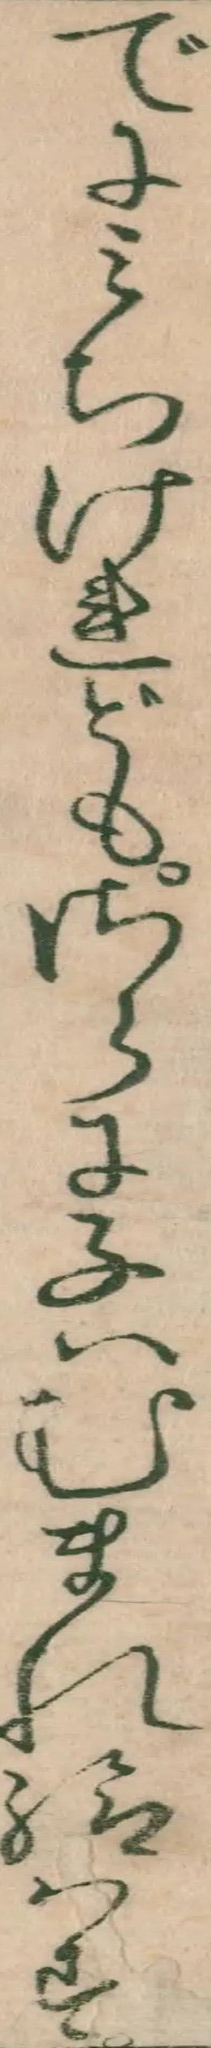でにみちけれども。さらに子はむまれ給はす。
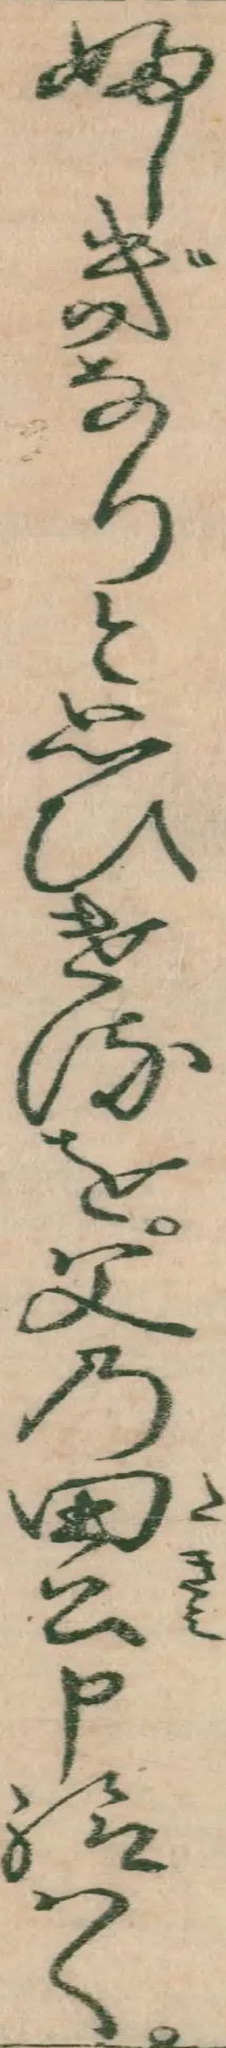ふしぎなりと思ひけるを。父の田公申給はく。
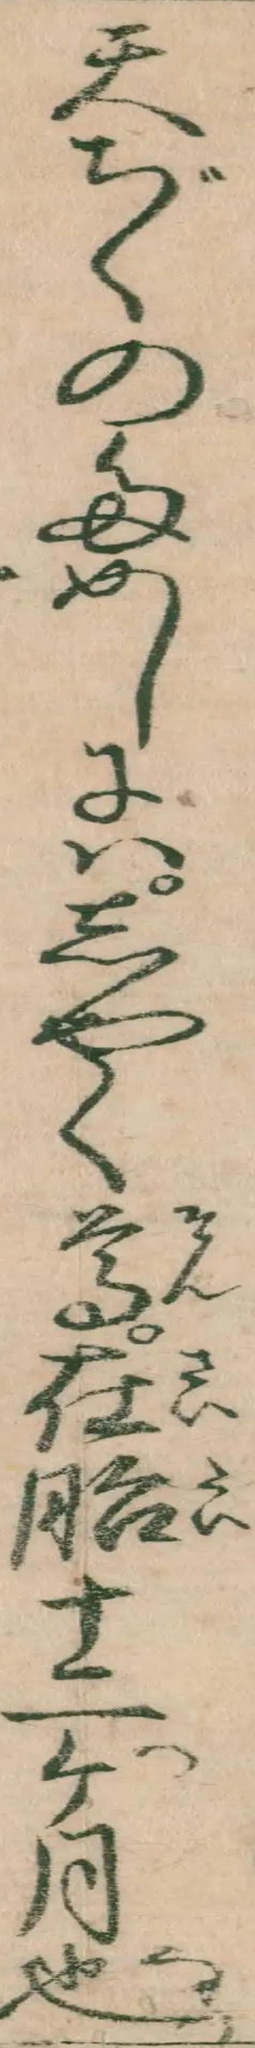天ぢくのためしには。しやく尊。在胎十二ケ月也
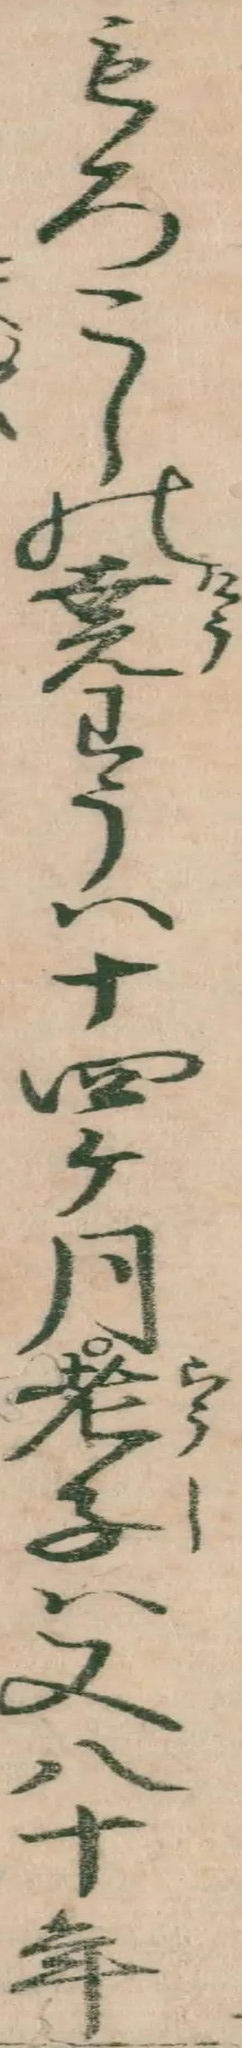もろこしの尭わうは十四ケ月。老子は又八十年
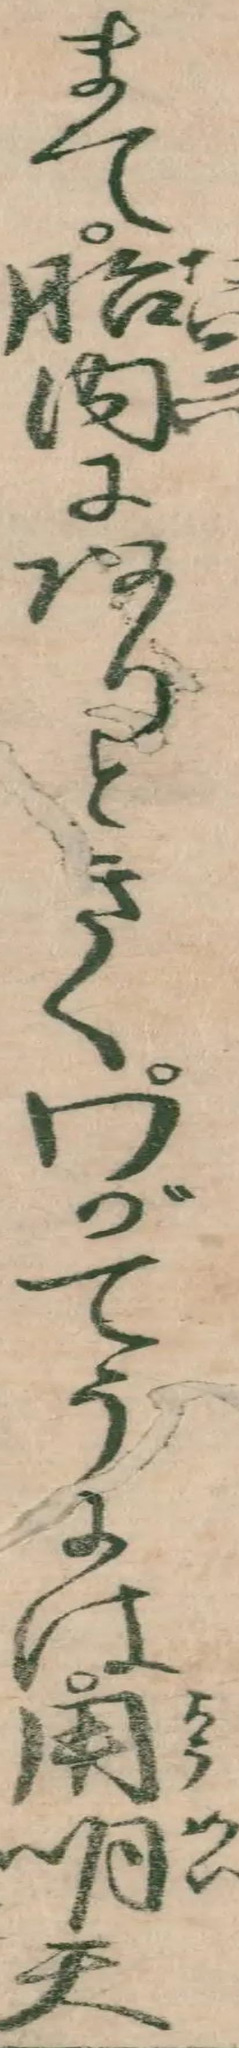まて。胎内にありときく。わがてうには。用明天
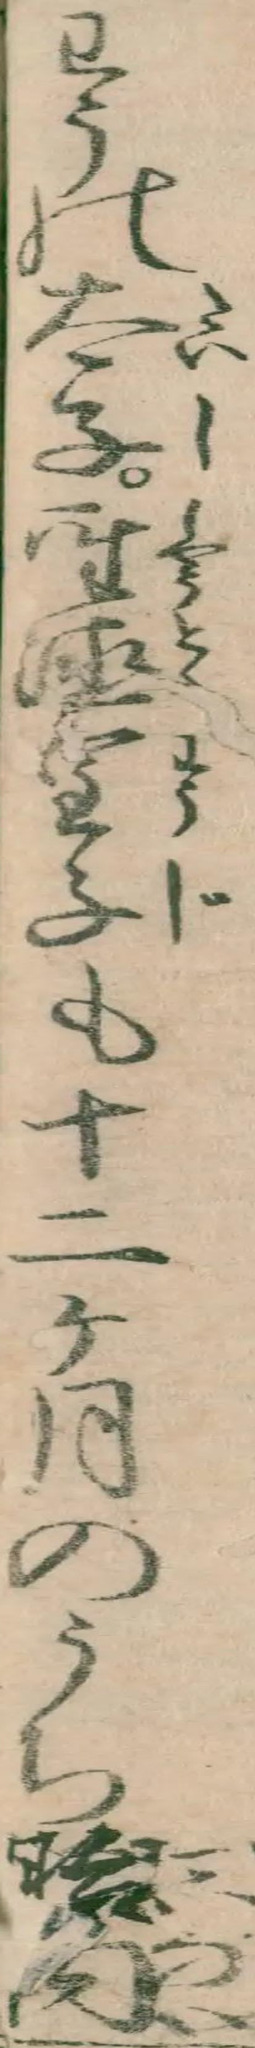わうの太子。聖徳皇子も十二ケ月のうち胎内
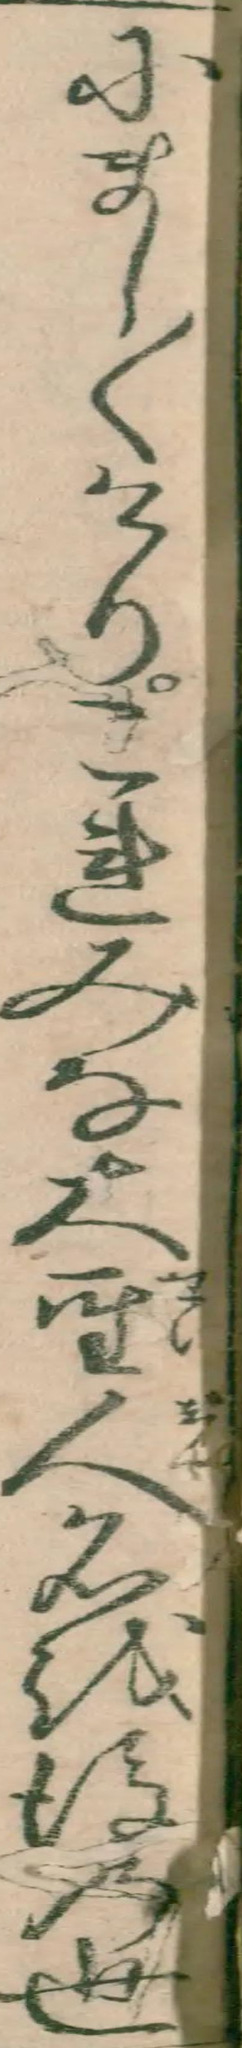にまし〳〵けり。これみな大聖人名を後の世
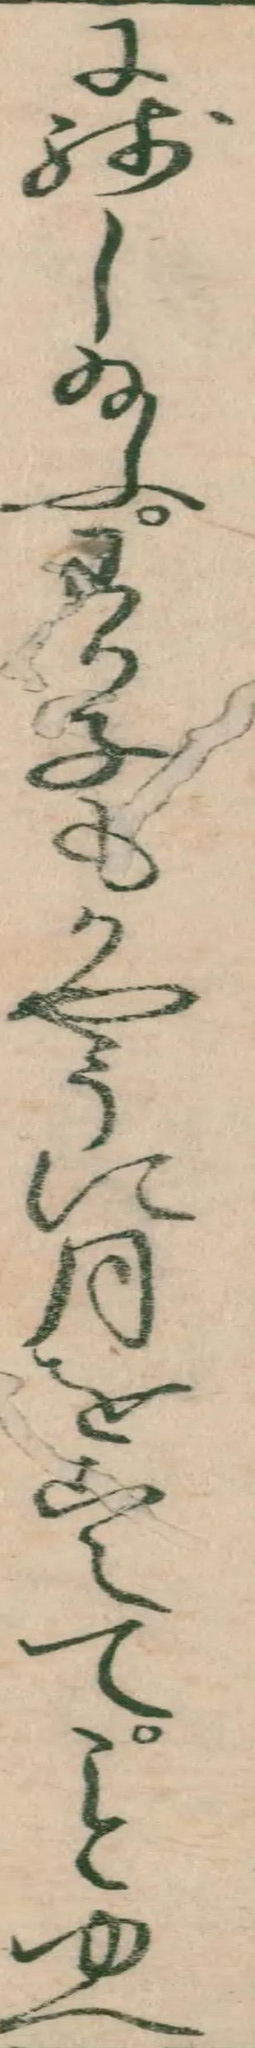に残し給ふ。わか子もかやうに月をこえて。ことゆへ
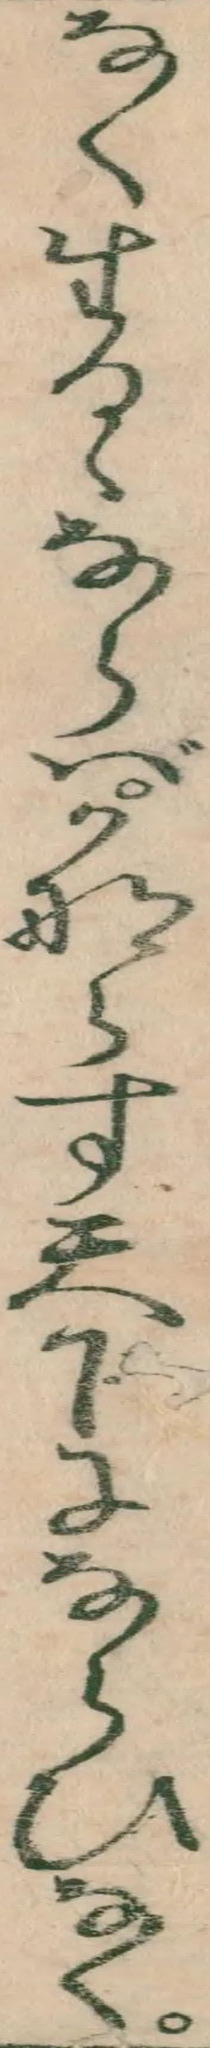なく生るゝならば。かならす天下にならひなく。
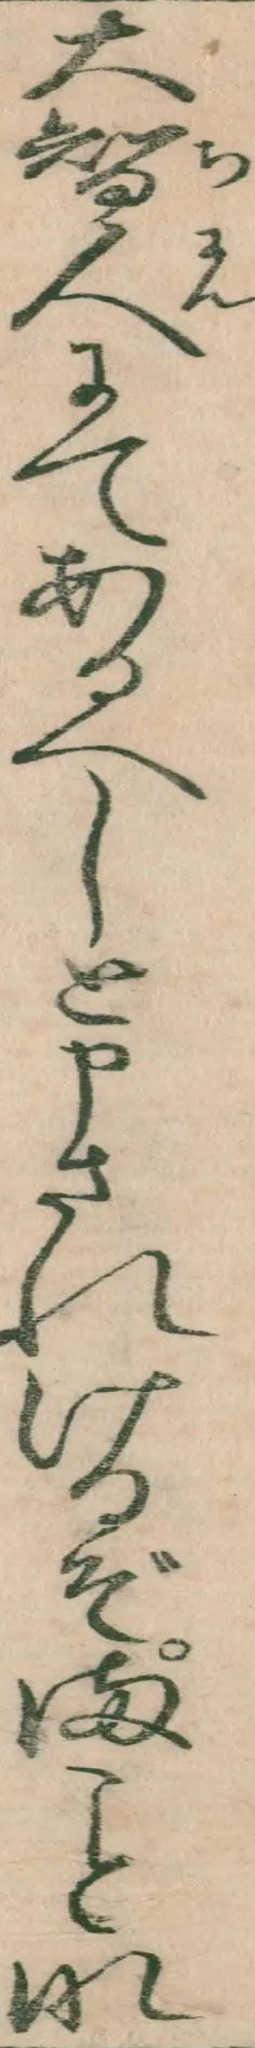大智人にてあるへしと申されけるぞ。まことな
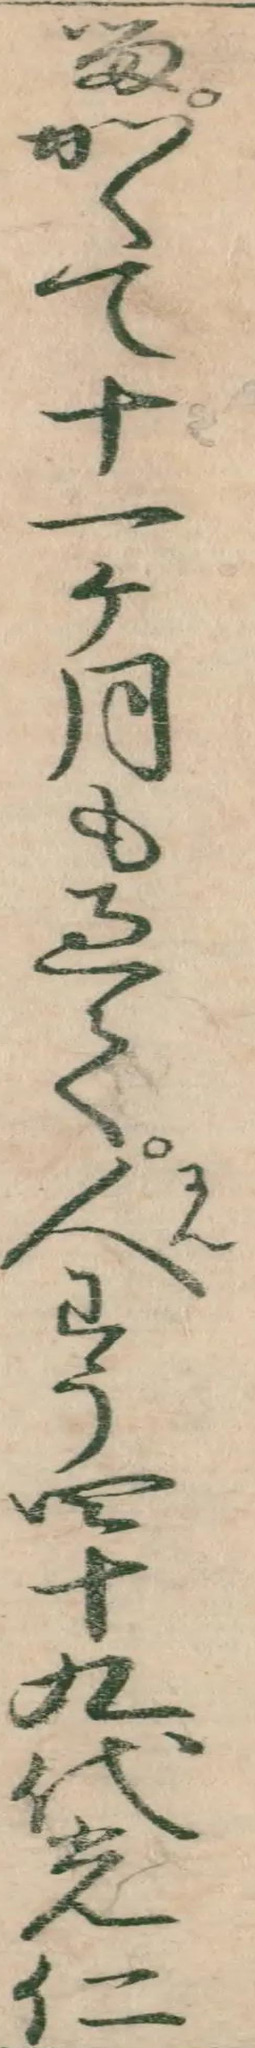る。かくて十一ケ月も過て。人わう四十九代光仁
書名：弘法大師御本地 3巻. [1]
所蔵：国立国会図書館 National Diet Library, JAPAN
